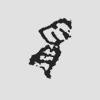胃
